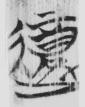復
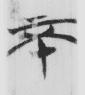不
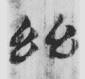𢆶
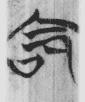命
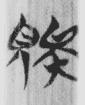{見矣}
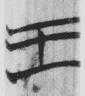王
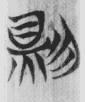則
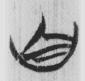自
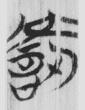罰
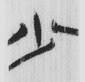少
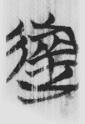{辶止㚔}
